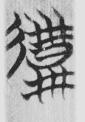{彳巤}
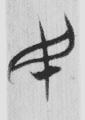民
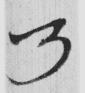乃
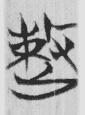{敕止}
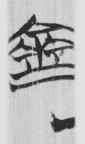齊
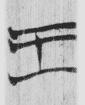王
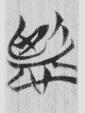監
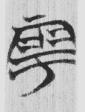𩁹
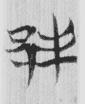邦
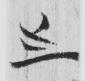之
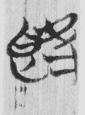既
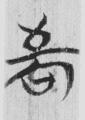茍
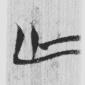亡
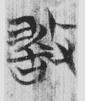敢
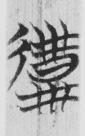{彳巤}
